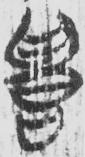豊（禮）
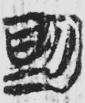則（則）
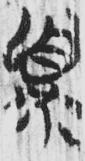○（寡）
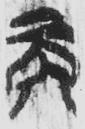而
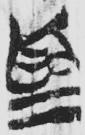爲
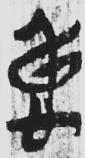○（仁）
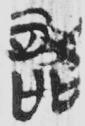○（教）
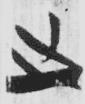之
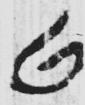㠯（以）
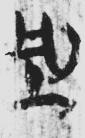型（刑）
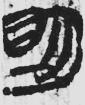則（則）
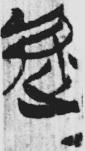逐
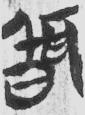○（聞）
